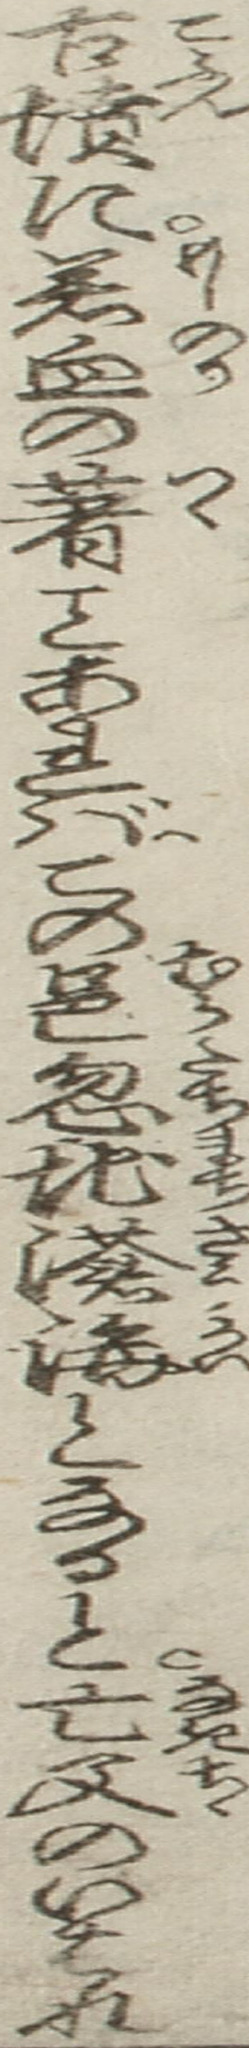古墳に若血の著ことあれば。この邑忽地滄海となると。亡父のいはれ
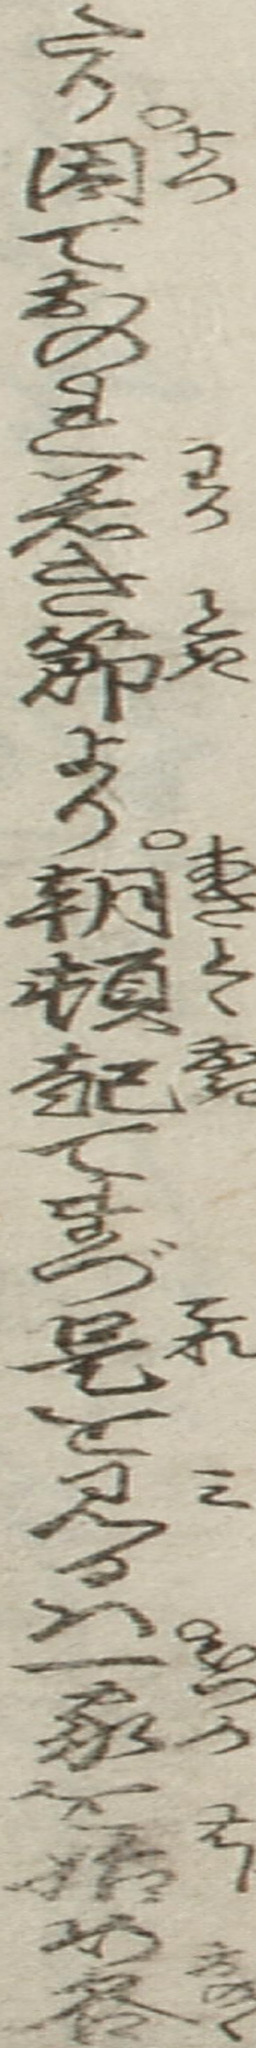たり。因ておのれ若き節より。朝頓起てまづ是を見るは。一家を始め各
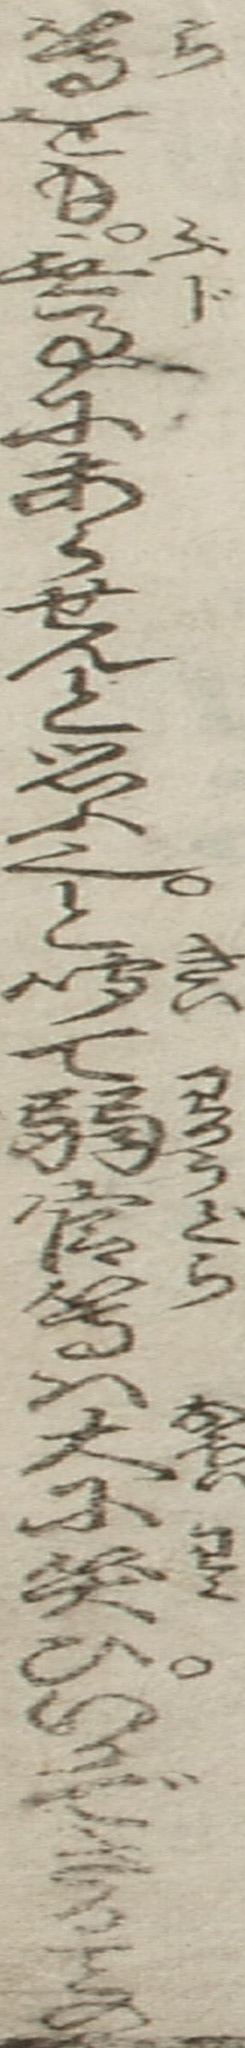等をも。無事にあらせんと思ふ也。と聞て弱官等は大に笑ひ。いかでさることの

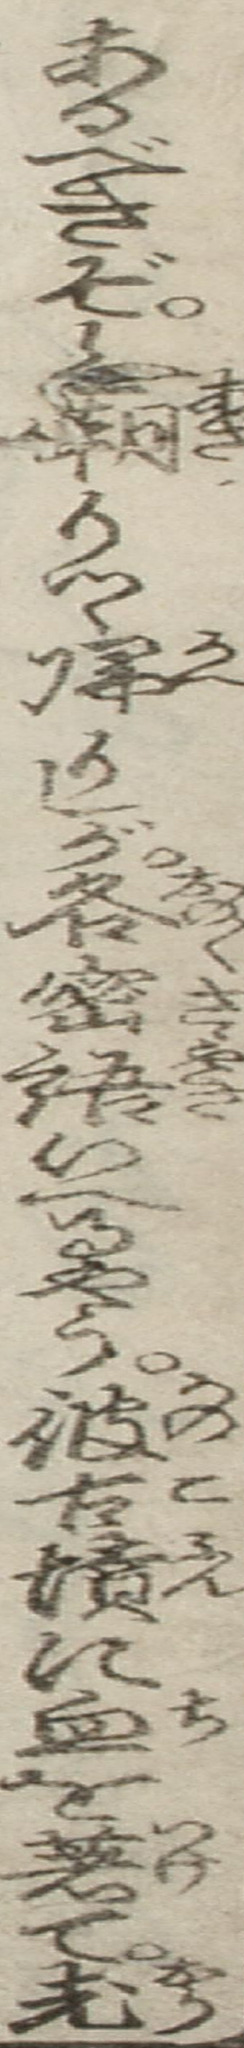あるべきぞ。と嘲りつゝ帰りしが。各密語いへるやう。彼古墳に血を著て。老
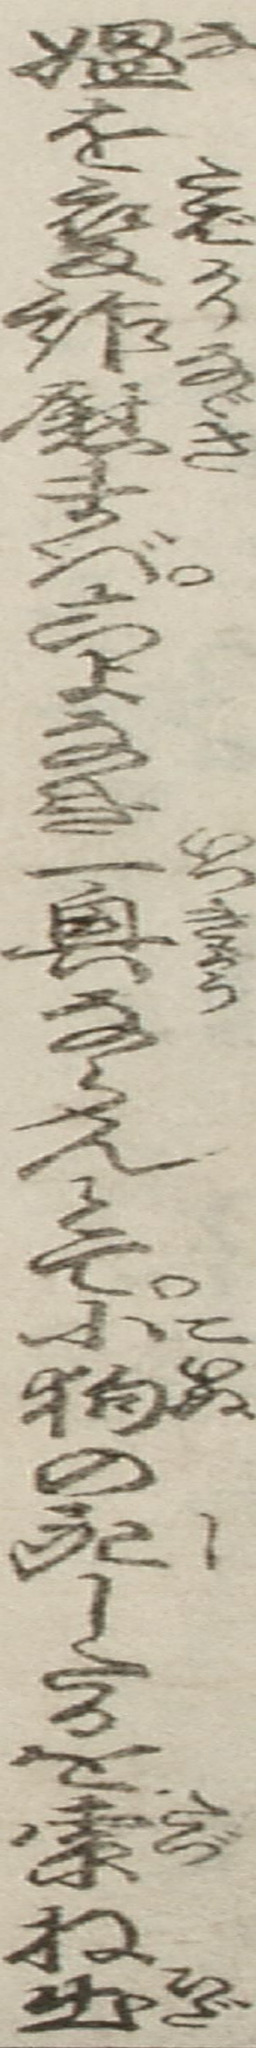媼を変詐慰まば。こよなき一興ならんとて。小狗の死したるを索ね出
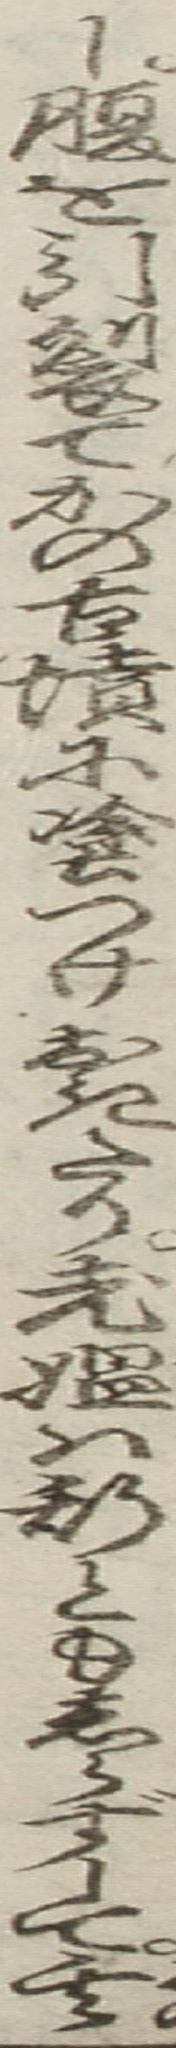し。腹を引裂て。かの古墳に塗つけおきたり。老媼は斯ともしらずして。其
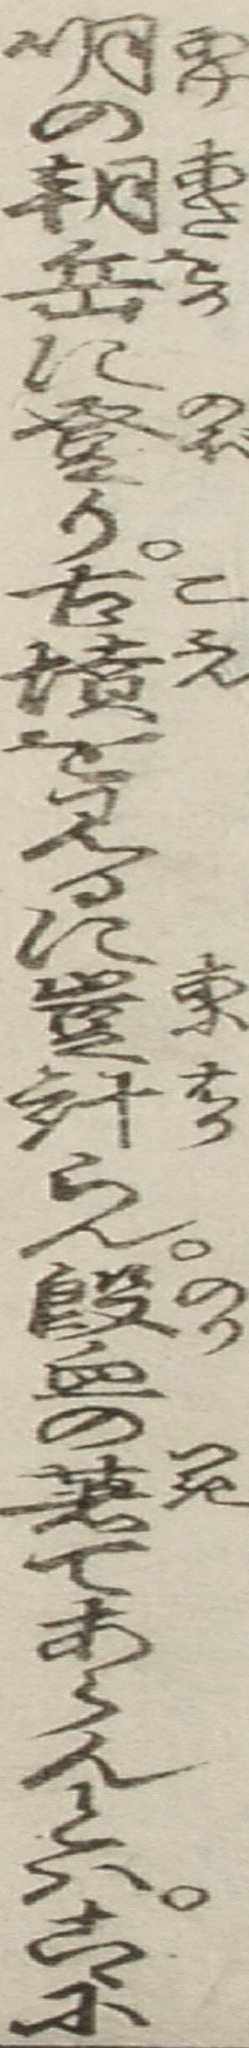明の朝岳に登り。古墳を見るに豈計らん。殷血の著てあらんとは。こゝに
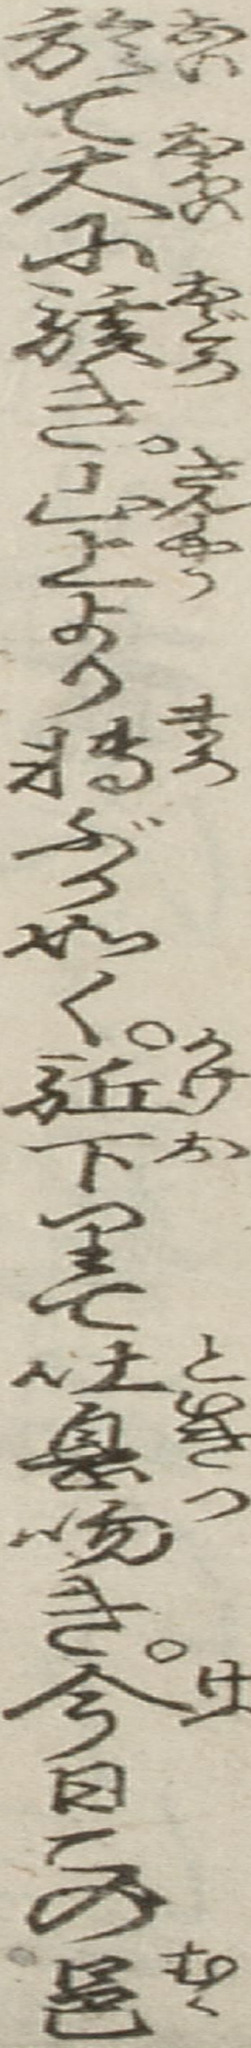於て大に駭き。山上より転ぶか如く。駈下りて吐息吻き。今日この邑
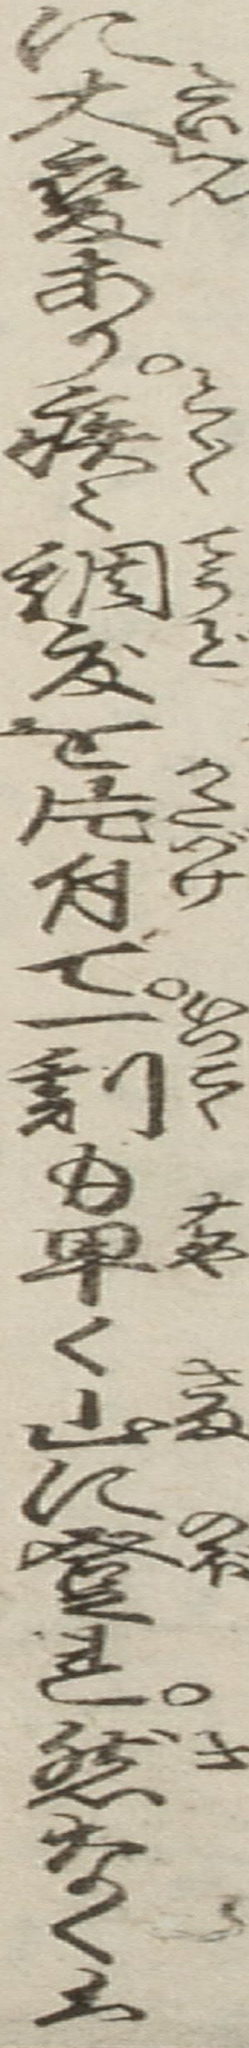に大変あり。疾々調度を片付て。一刻も早く山に登れ。然なくは
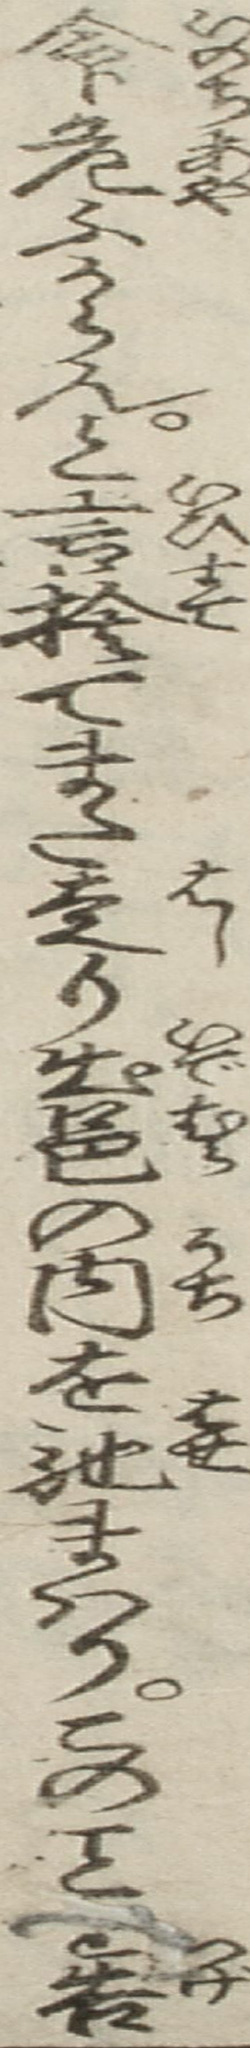命危ふからん。と言捨てまた走り出邑の内を馳まはり。このことを告
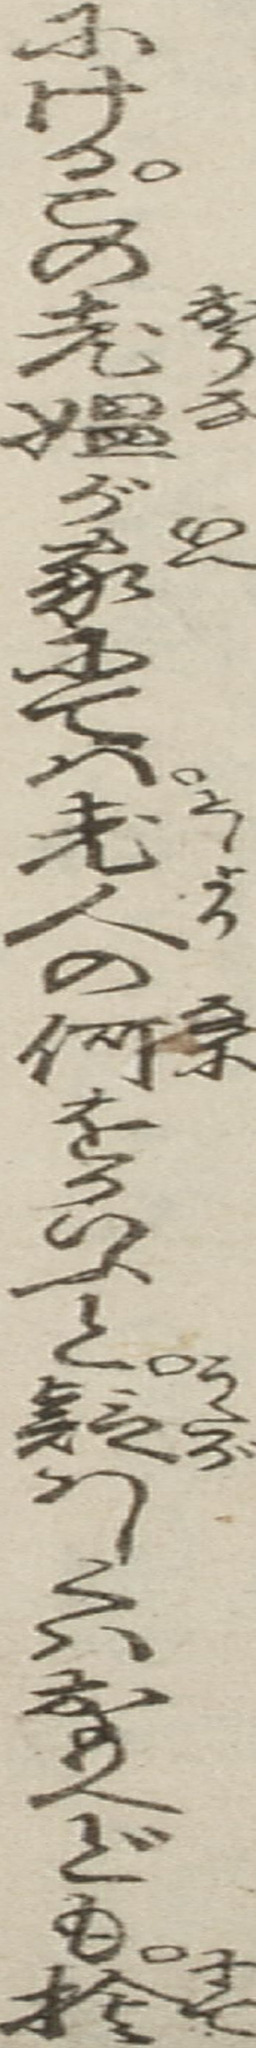にける。この老媼が家にては。老人の何をかいふと。疑はしくはおもへども。捨
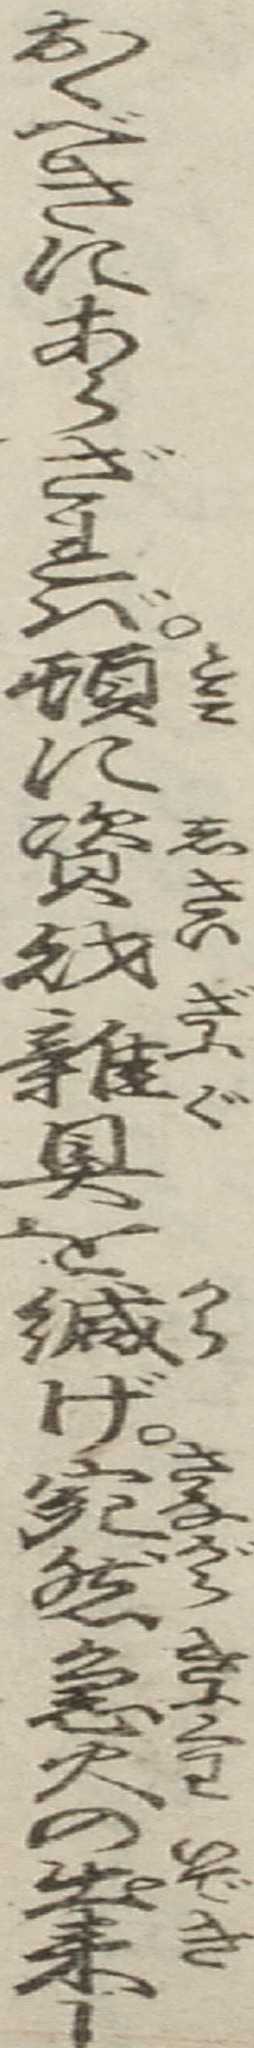おくべきにあらざれば。頓に資財雑具を緘げ。宛然急火の出来し
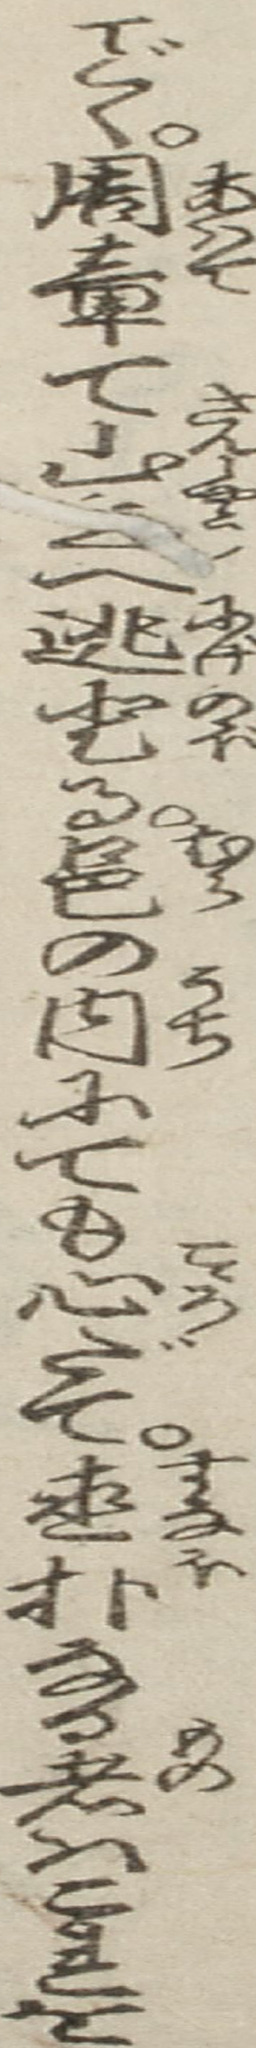ごとく。周章て山上へ逃登る。邑の内にても心だて。直朴なる者はこれを
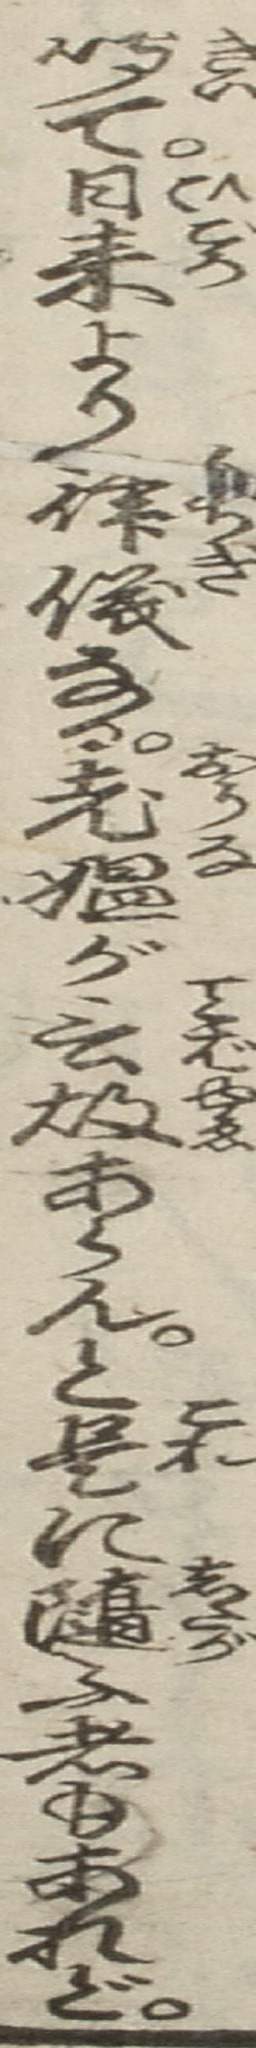聞て。日来より律儀なる。老媼が言故あらん。と是に随ふ者もあれど。
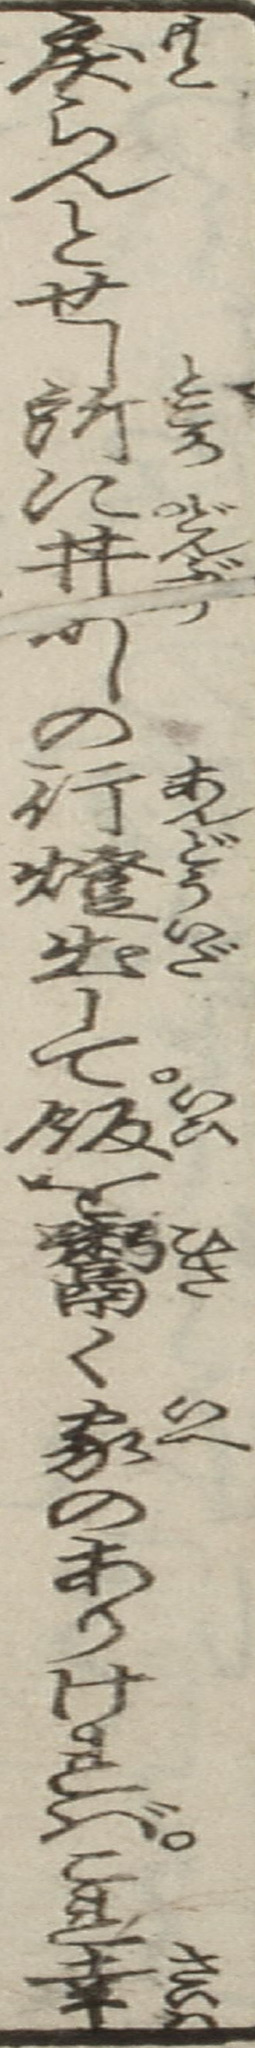戻らんとせし所に。丼めしの行燈出して。飯を鬻く家のありけらば。これ幸
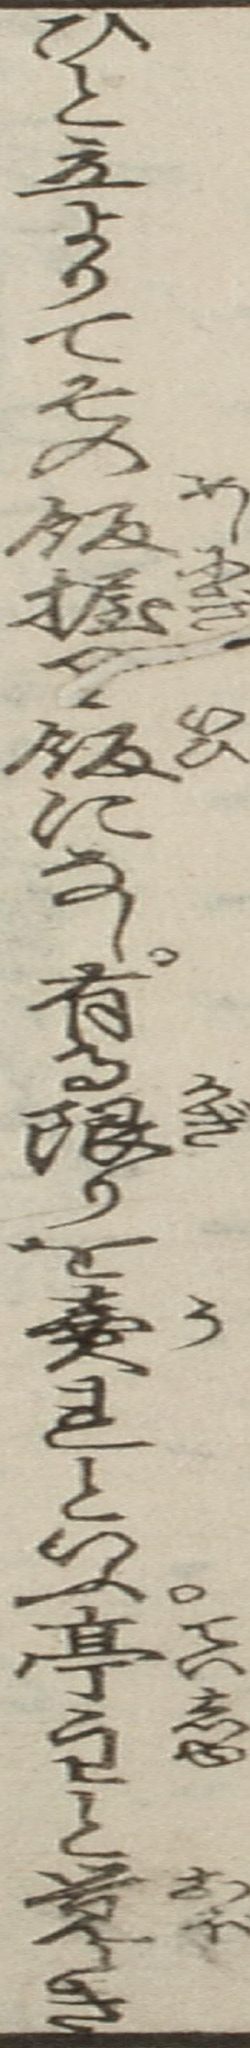ひと立よりてその飯握り飯になし。有る限りを売れといふ。亭主と覚しき
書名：安政見聞録　上
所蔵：東京大学地震研究所図書室 Earthquake Research Institute Library, The University of Tokyo, JAPAN
